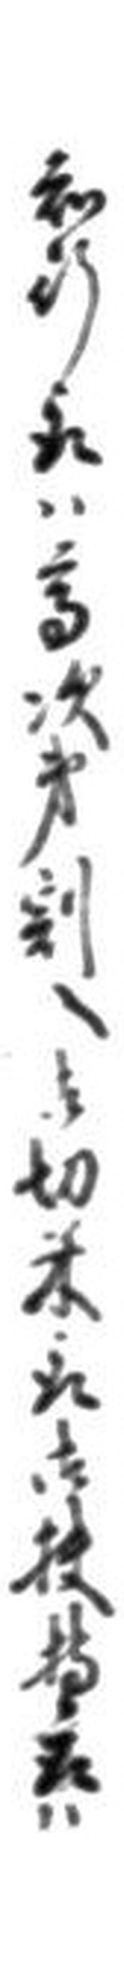知行取ハ高次第割入御切米取御扶持取ハ
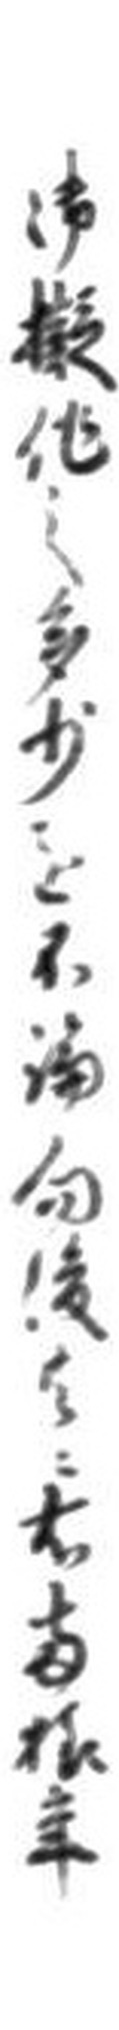御擬作之多少を不論向後共ニ右両様年
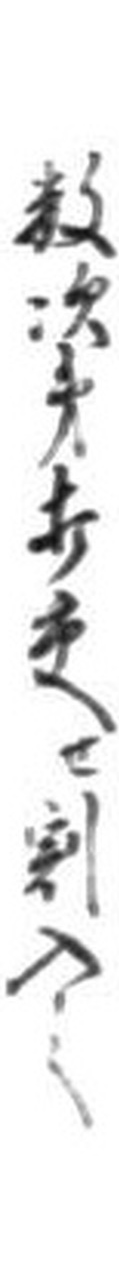数次第打交せ割入之
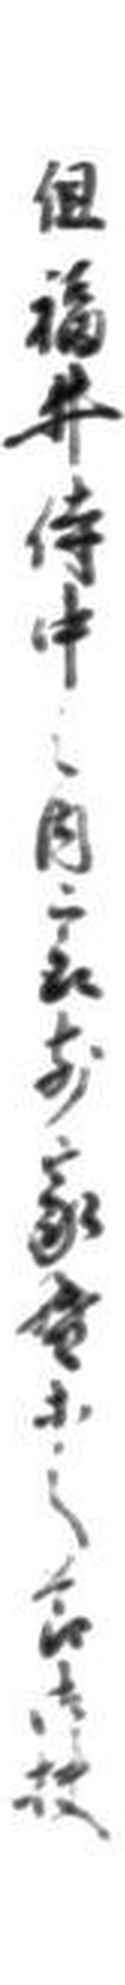但福井侍中之内最前家督等之節御扶
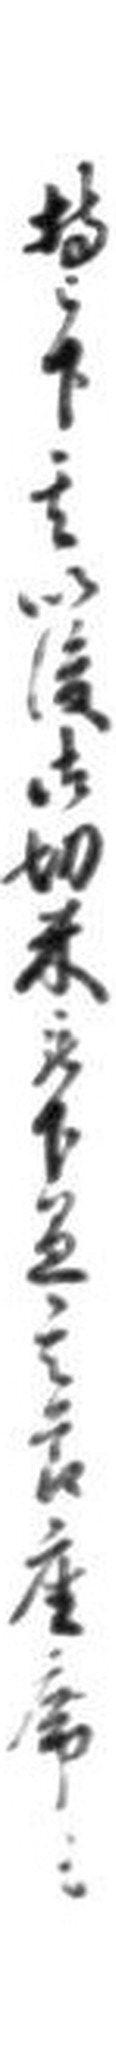持被下其以後御切米被下置其節座席も
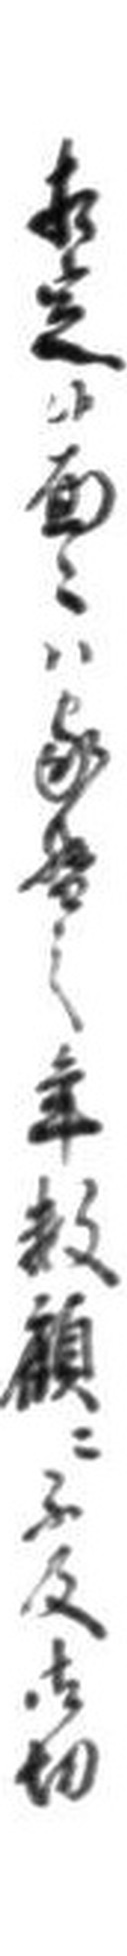相定候面々ハ家督之年数顧ニ不及御切
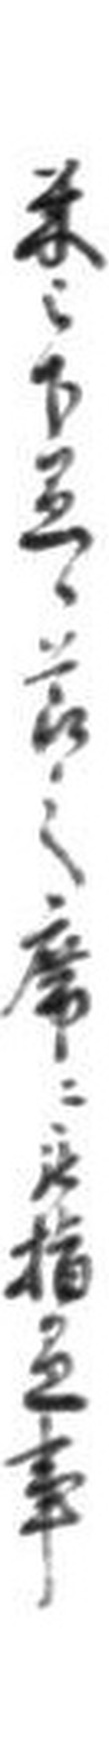米被下置候節之席ニ被指置事

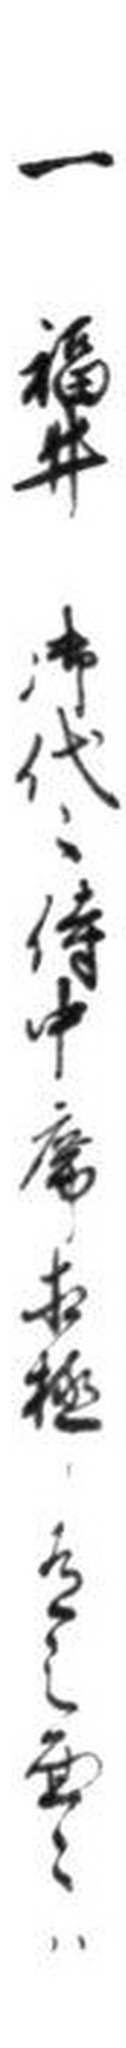一福井御代々侍中席相極有之面々ハ
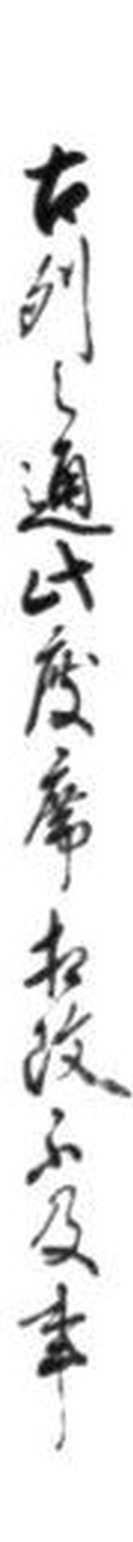右列之通此度席相改不及事
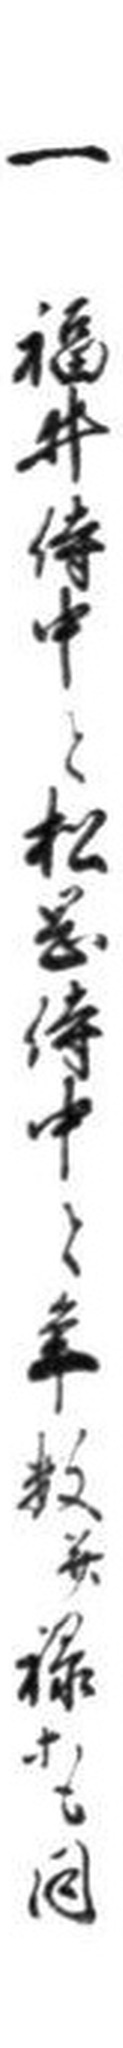一福井侍中と松岡侍中と年数并禄等も同
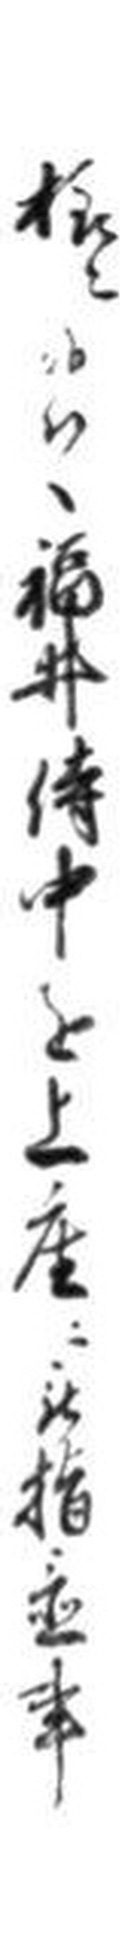様ニ候ハヽ福井侍中を上座ニ被指置事
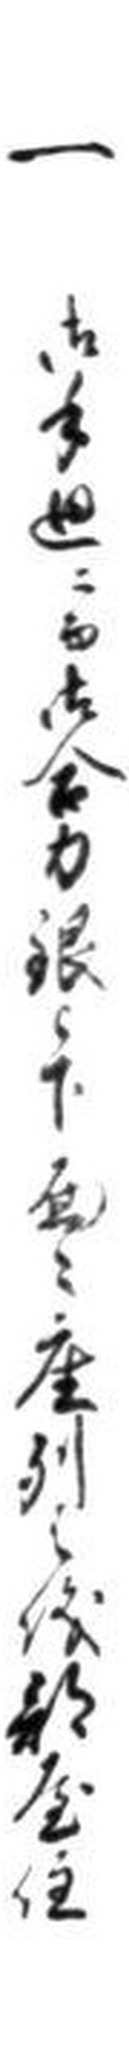一御手廻ニ而御合力銀被下面々座列之儀部屋住
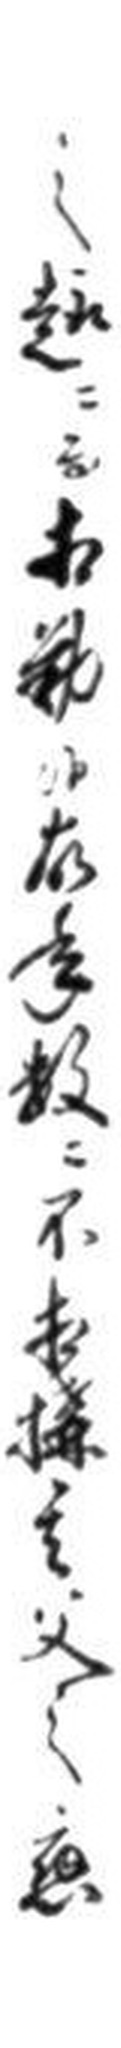之趣ニ而相勤候故年数ニ不相構其父之応
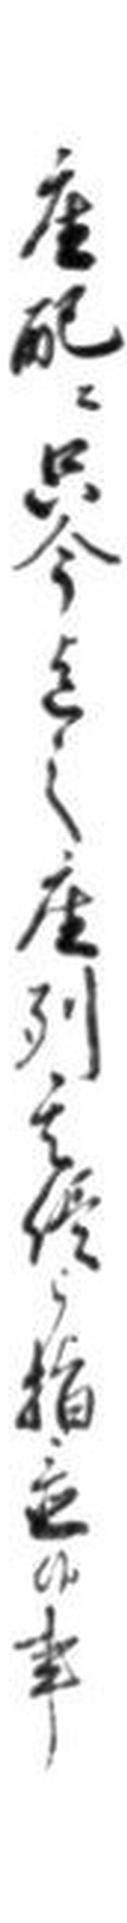座配ニ只今迄之座列其儘被指置候事
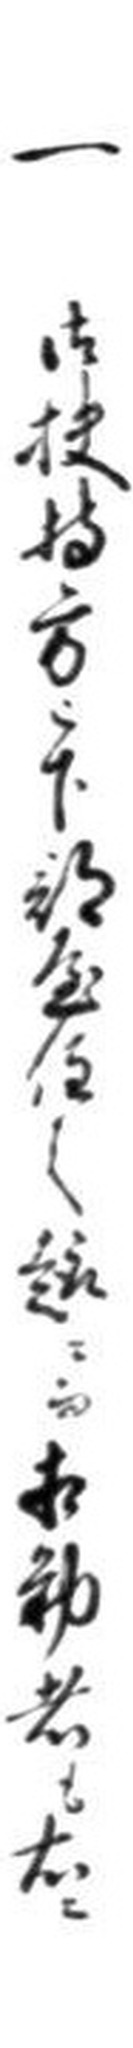一御扶持方被下部屋住之趣ニ而相勤者も右ニ
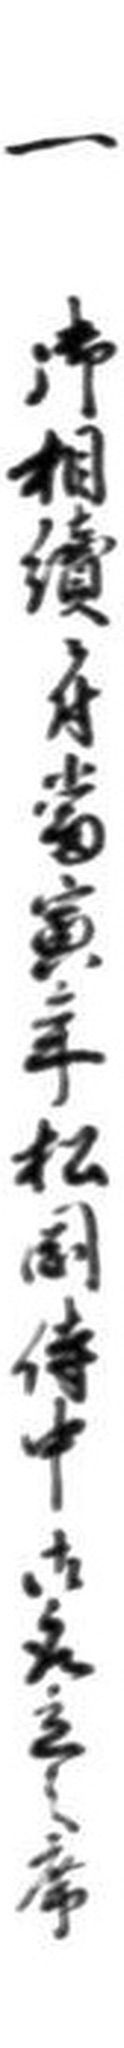一御相続ニ付当寅年松岡侍中御取立之席
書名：家譜 三十五 宗昌公 従享保六年到同七年
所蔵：福井県文書館 Fukui Prefectural Archives
